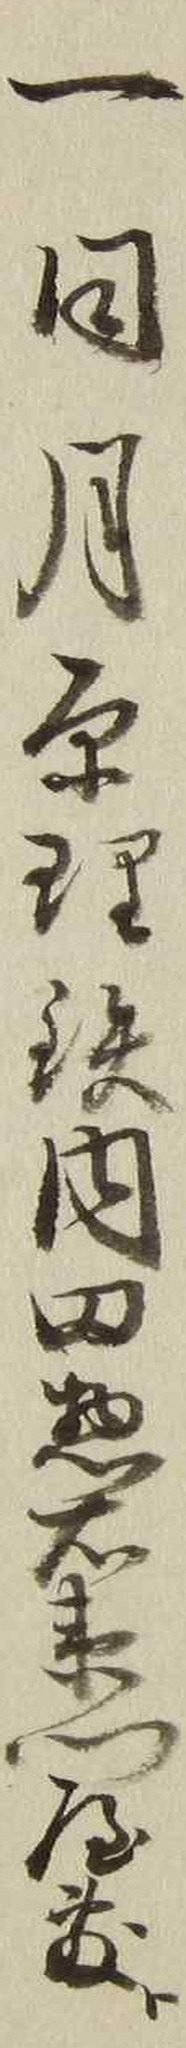一同月原理鉄内田惣右衛門屋敷ト
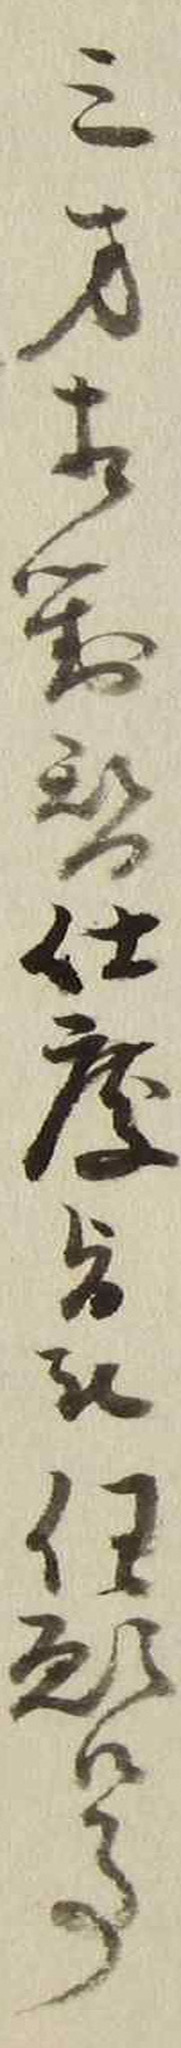三方相対替仕度旨被任願候事
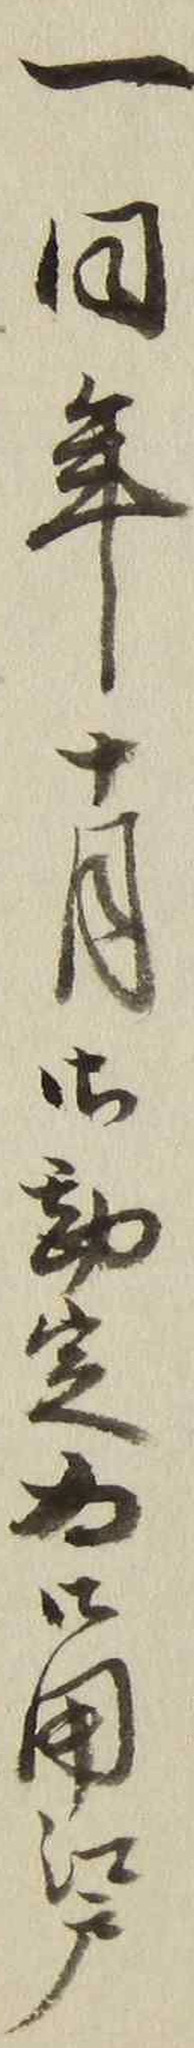一同年十月御勘定為御用江戸
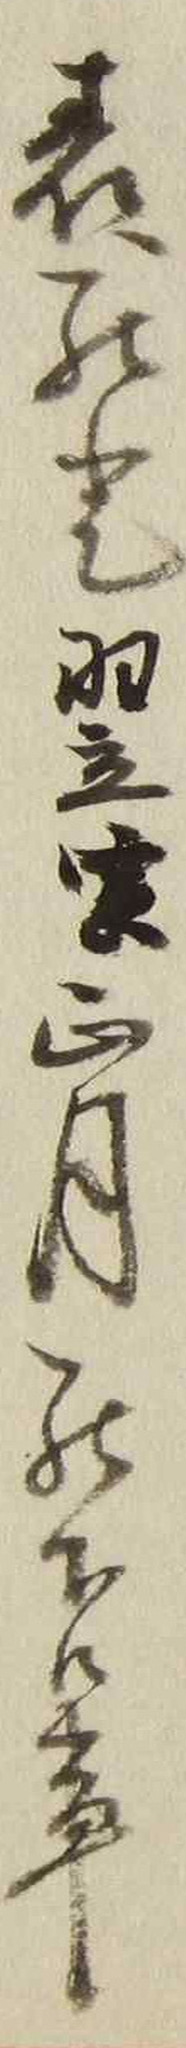表へ罷登翌寅正月罷下候事
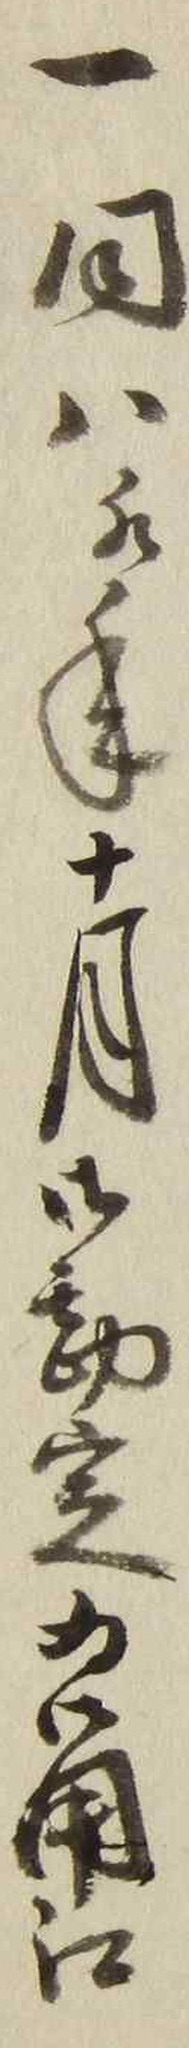一同八卯年十月御勘定為御用江

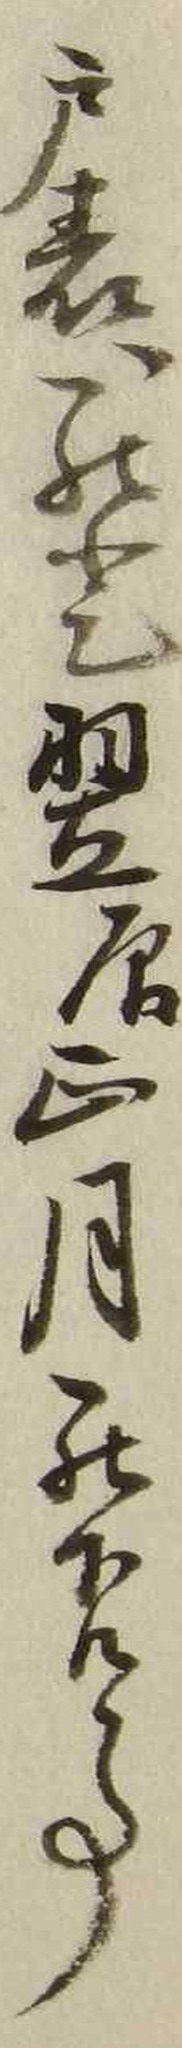戸表へ罷登翌辰正月罷下候事
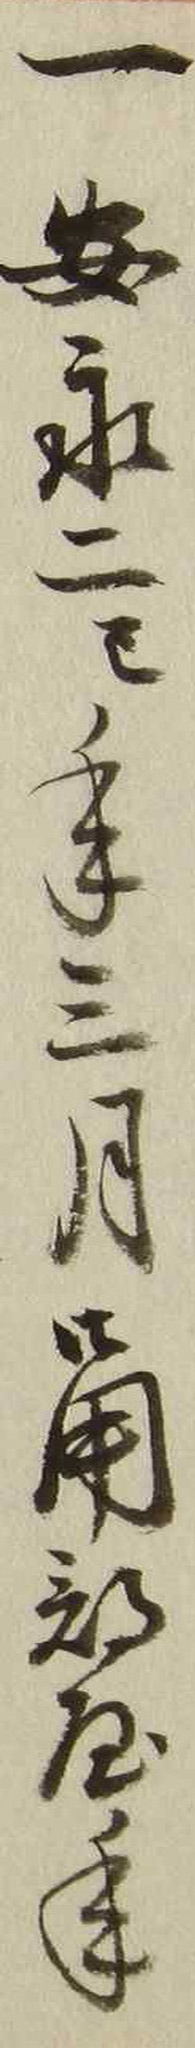一安永二巳年三月御用部屋年
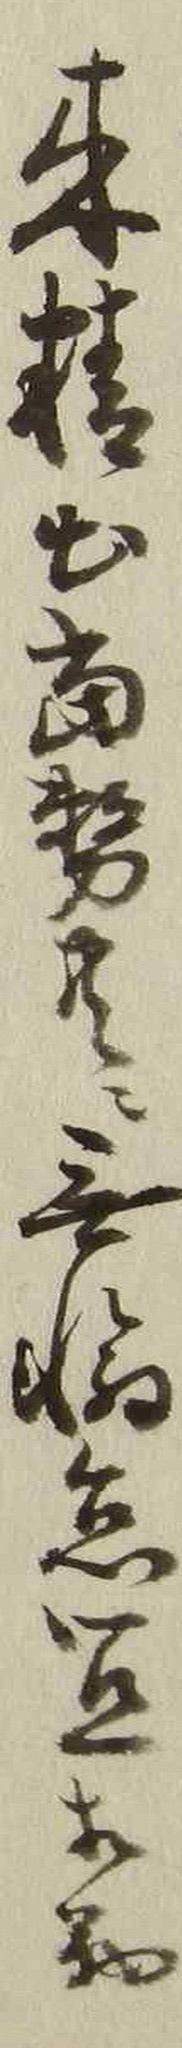来精出当務共ニ無懈怠宜相勤
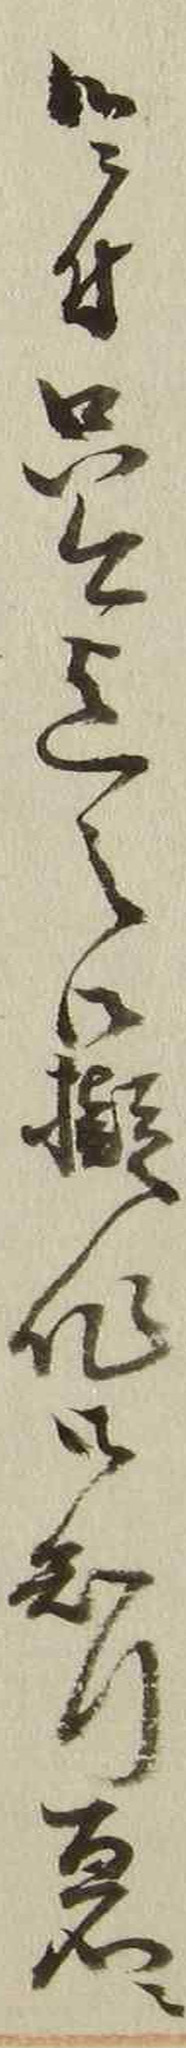候ニ付只今迄之御擬作御知行百石ニ
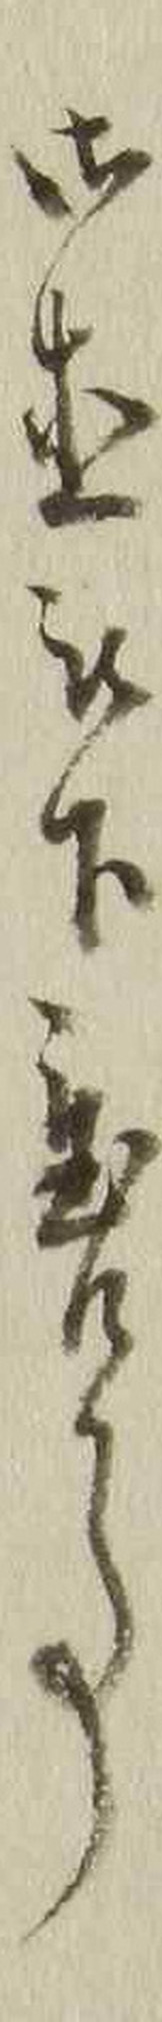御直被下置候事
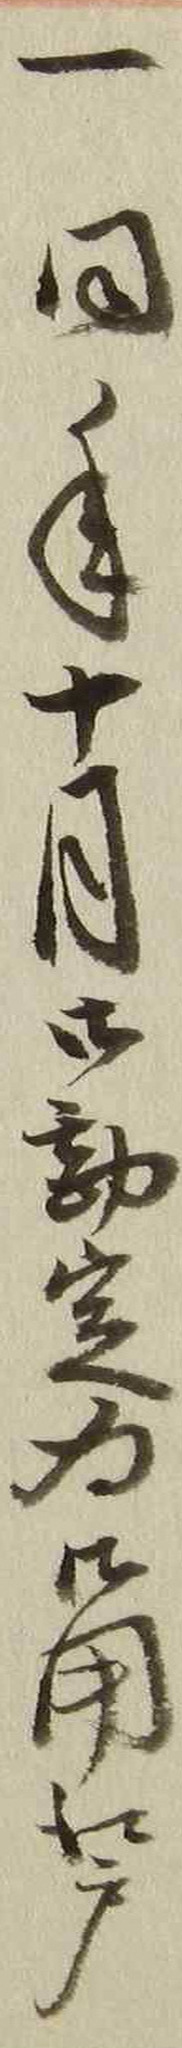一同年十月御勘定為御用江戸
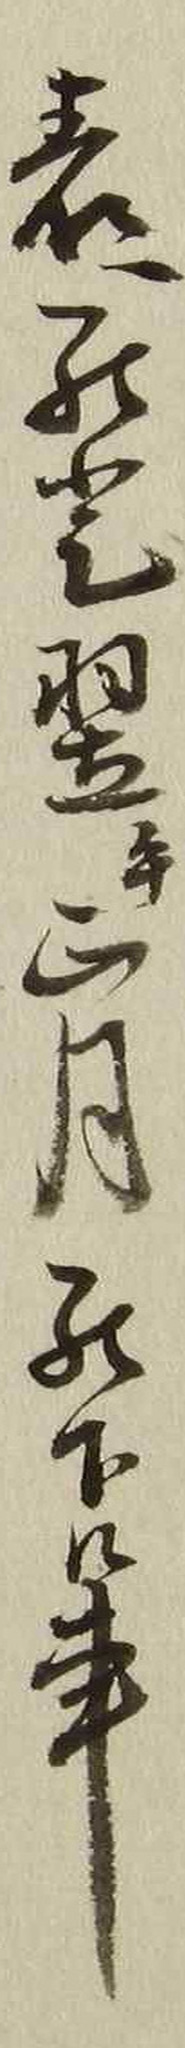表へ罷登翌午正月罷下候事
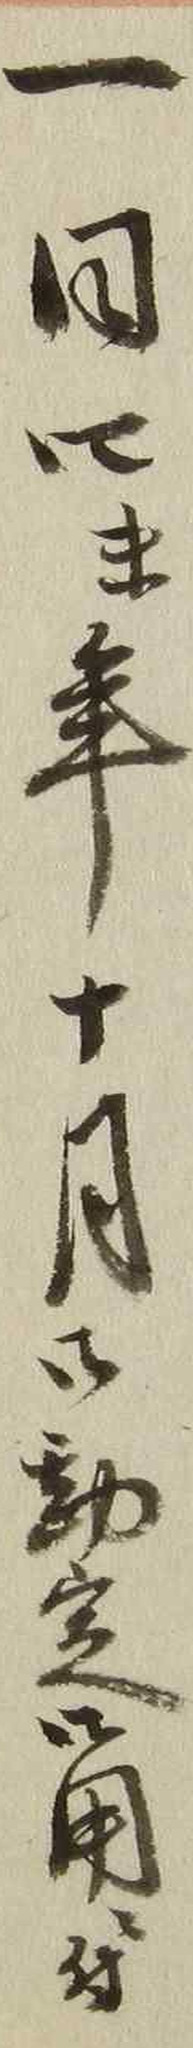一同四未年十月御勘定御用ニ付
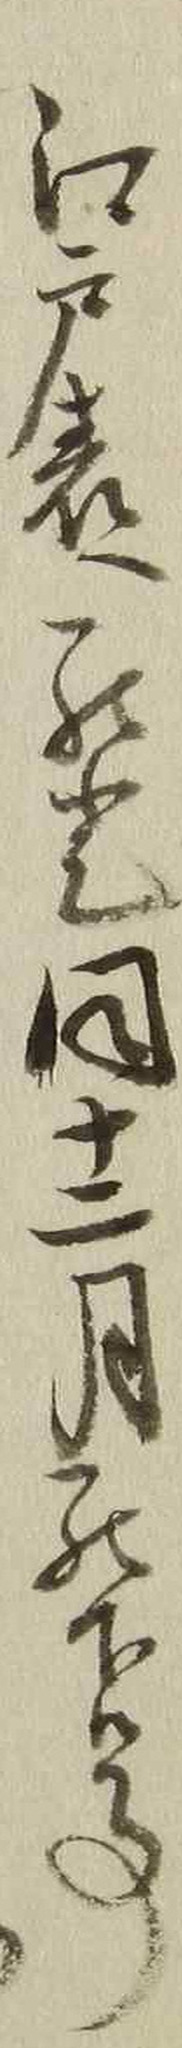江戸表へ罷登同十二月罷下候事
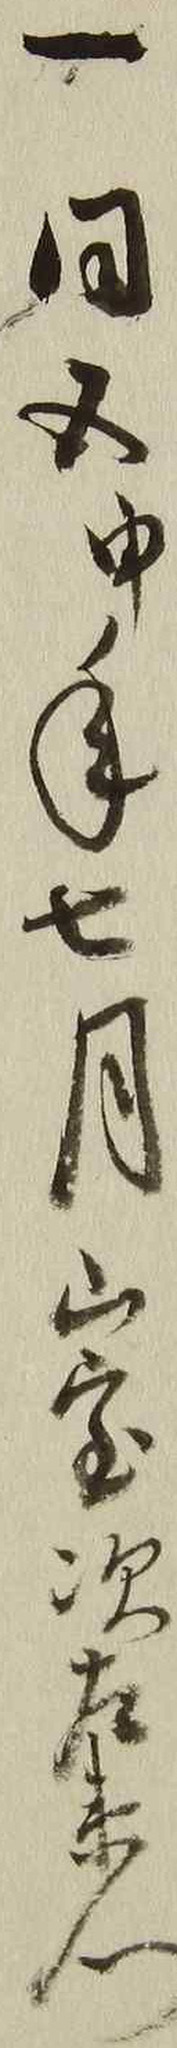一同五申年七月山室次左衛門
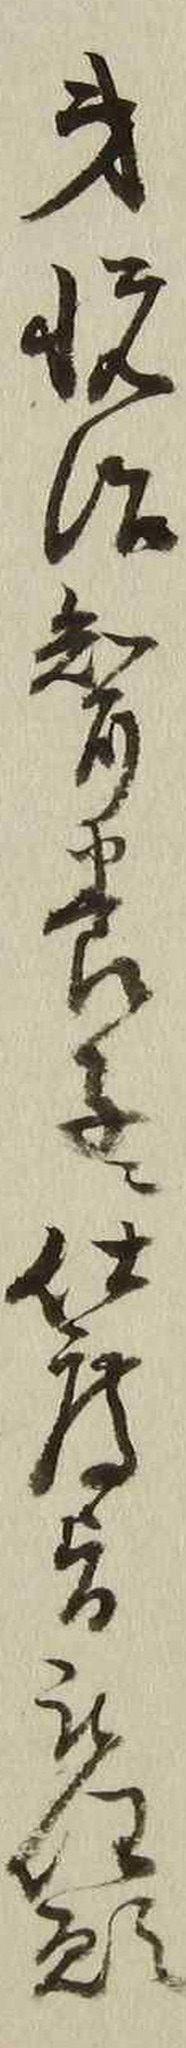弟悦治婿養子仕度旨被任願
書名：諸士系譜　巻之53　に之部4
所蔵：会津若松市立会津図書館
